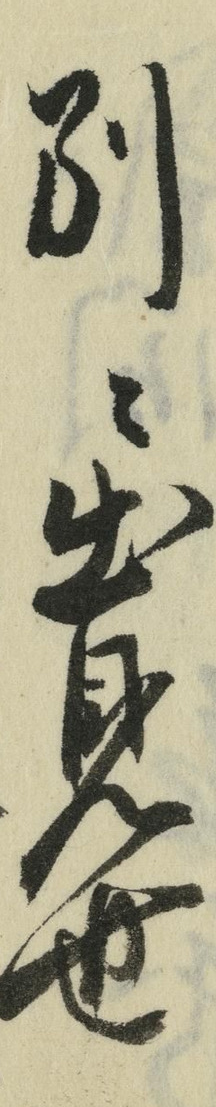別二出見世
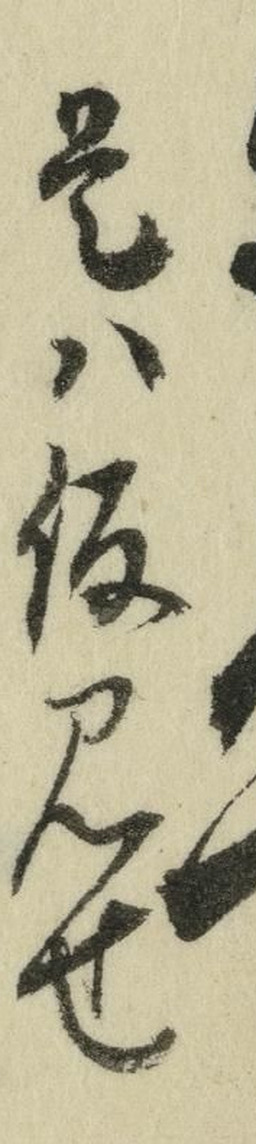是ハ仮見世

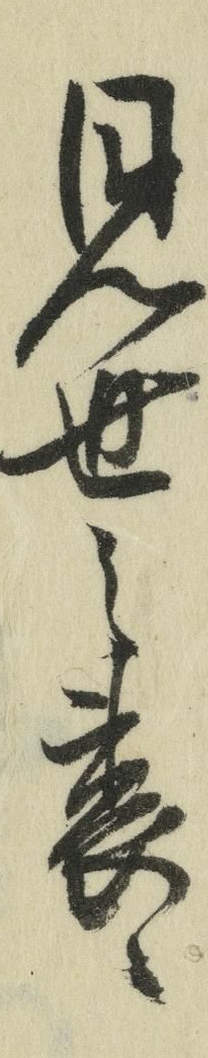見世之裏二
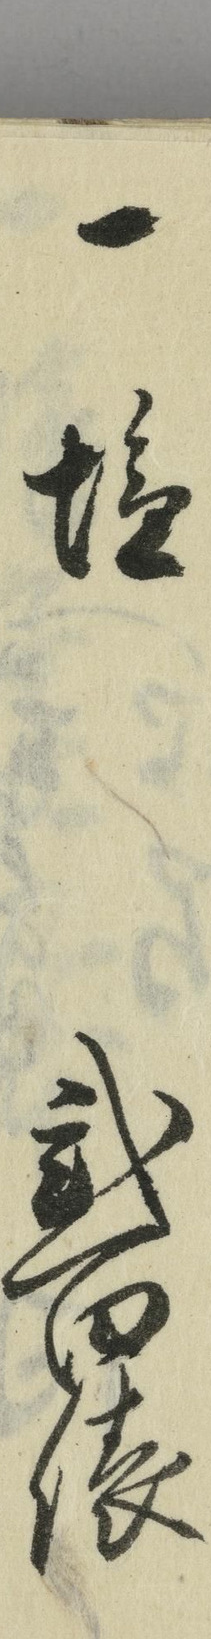一塩弐百俵
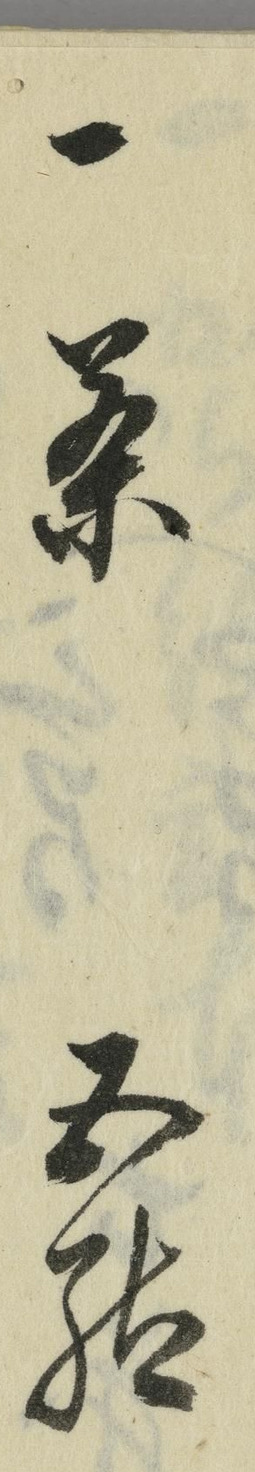一茶五駄
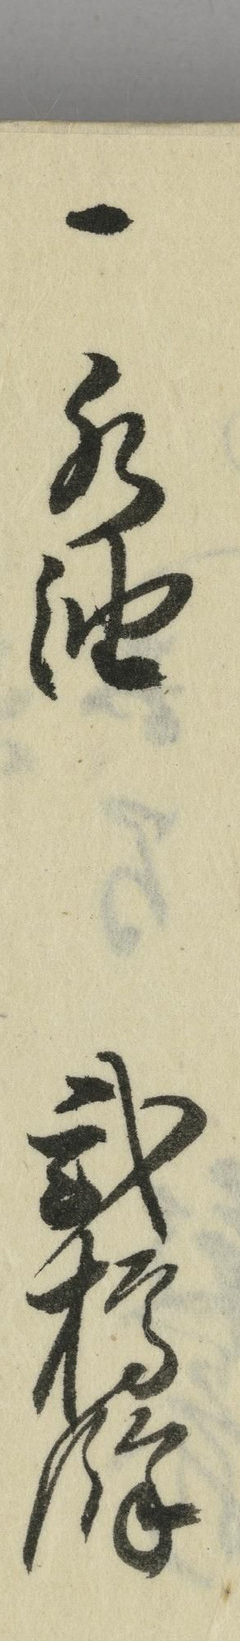一水油弐樽餘
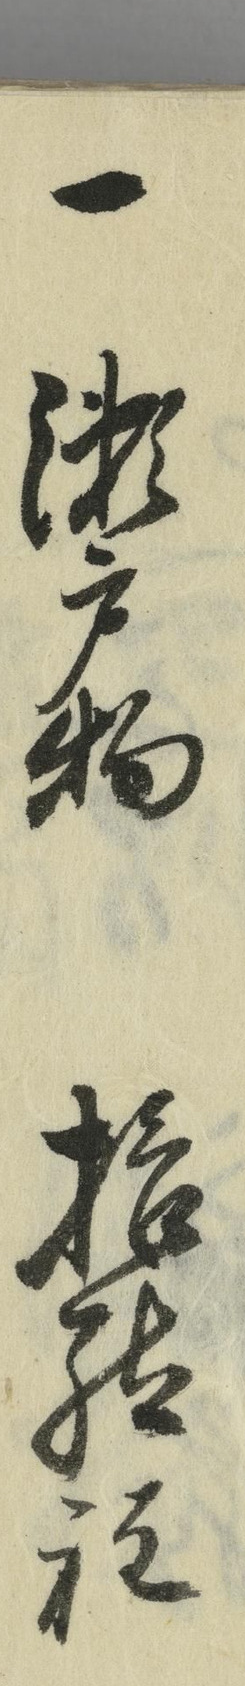一瀬戸物拾駄程
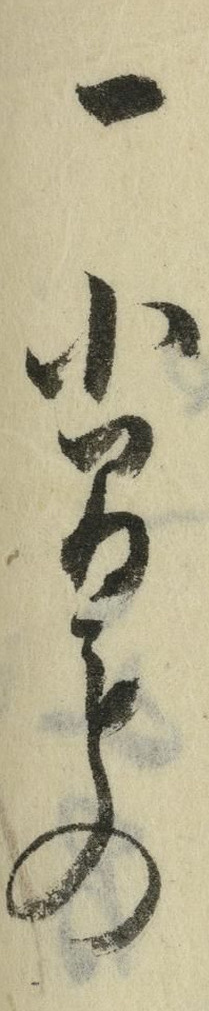一小間もの

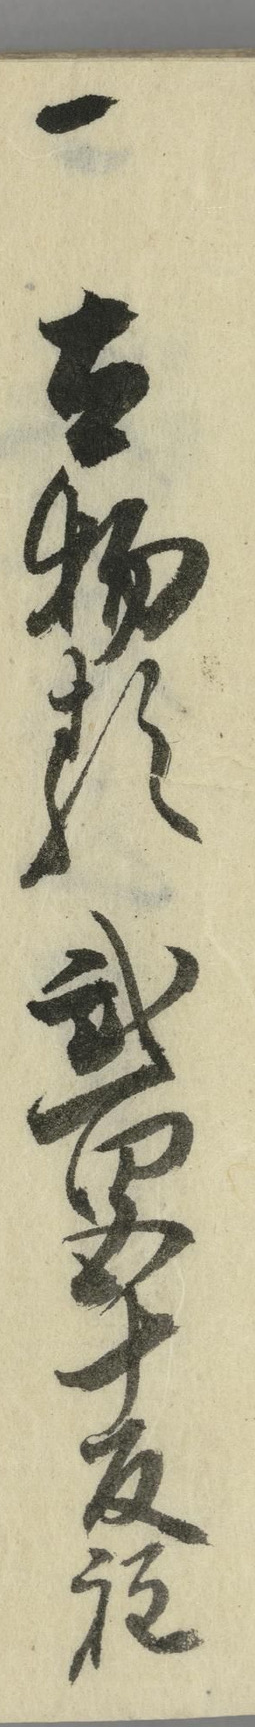一太物類弐百五十反程
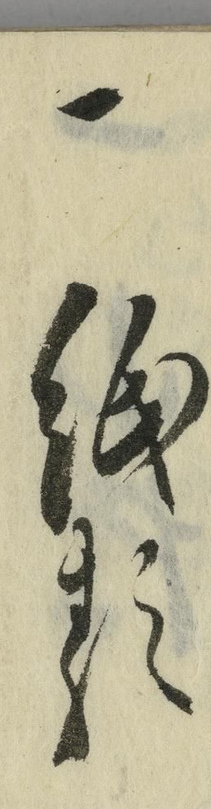一紙類
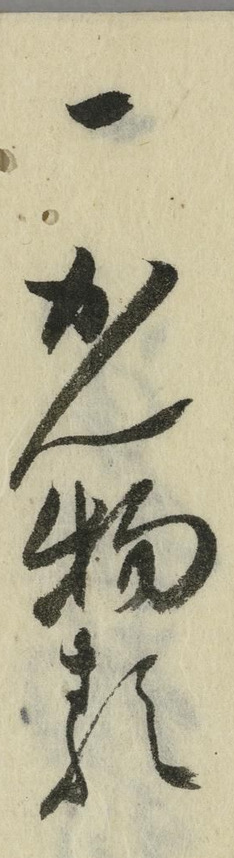一かん物類
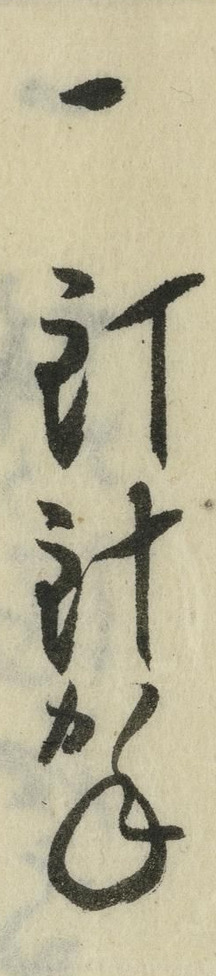一釘針かね
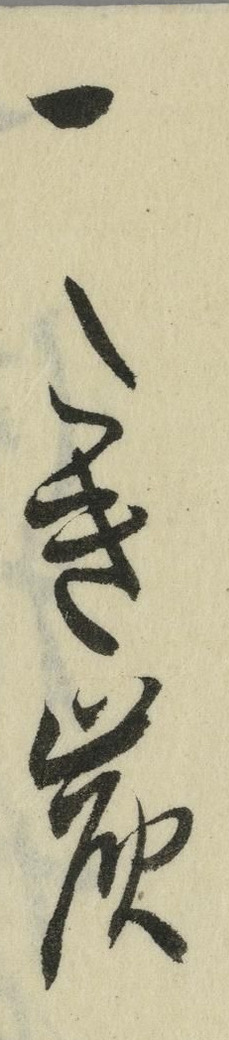一たき炭
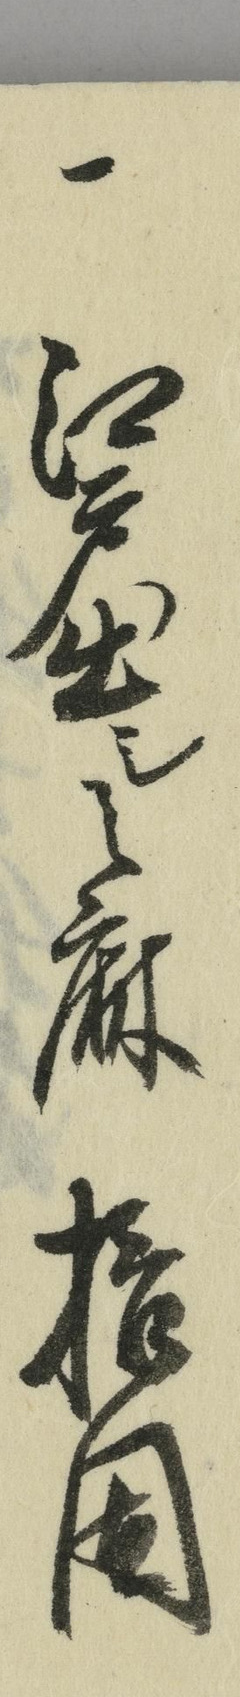一江戸出し之麻拾固
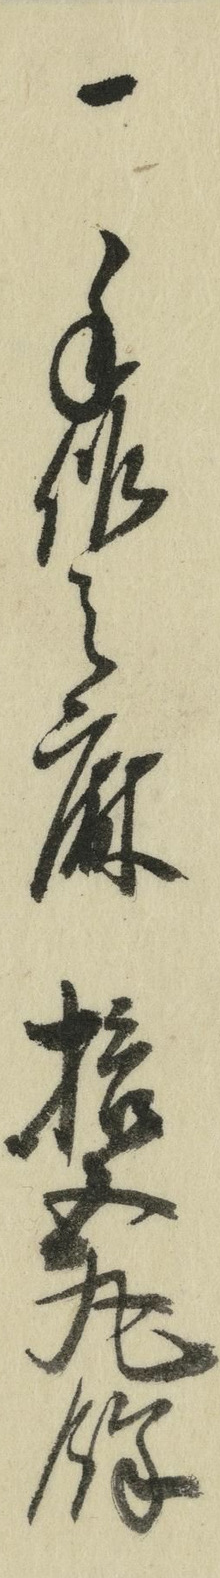一手作之麻拾五丸餘
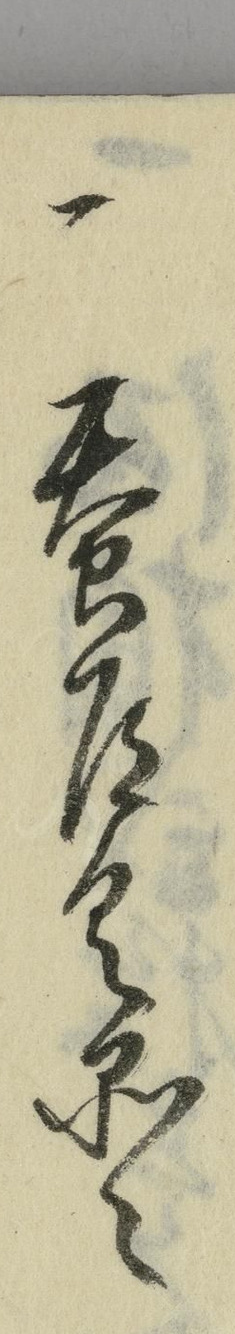一蚕道具品々
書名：天明淺間噴火ニ関スル書類
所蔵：東京大学地震研究所図書室 Earthquake Research Institute Library, The University of Tokyo, JAPAN
